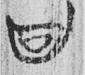昌
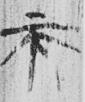天
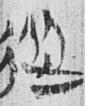從
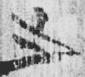之
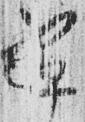好
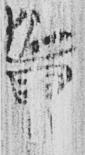○（旺）
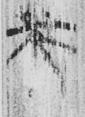天
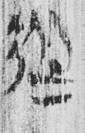從
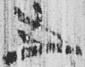之
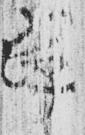好
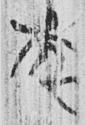尨
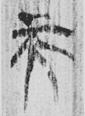天
